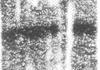一
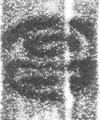合
